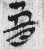○（期）
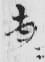十月
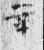辛
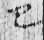巳
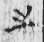之
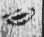日
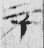不
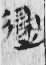歸
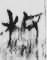板
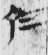於
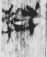登
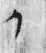人
